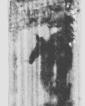人
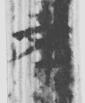不
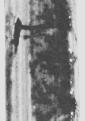厇
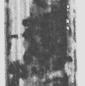亓
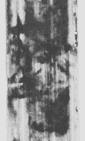灋
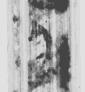人
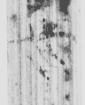必
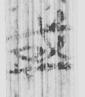或
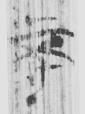不
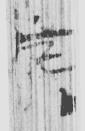厇
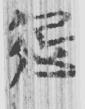起
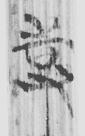事
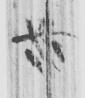必
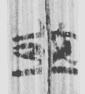或
